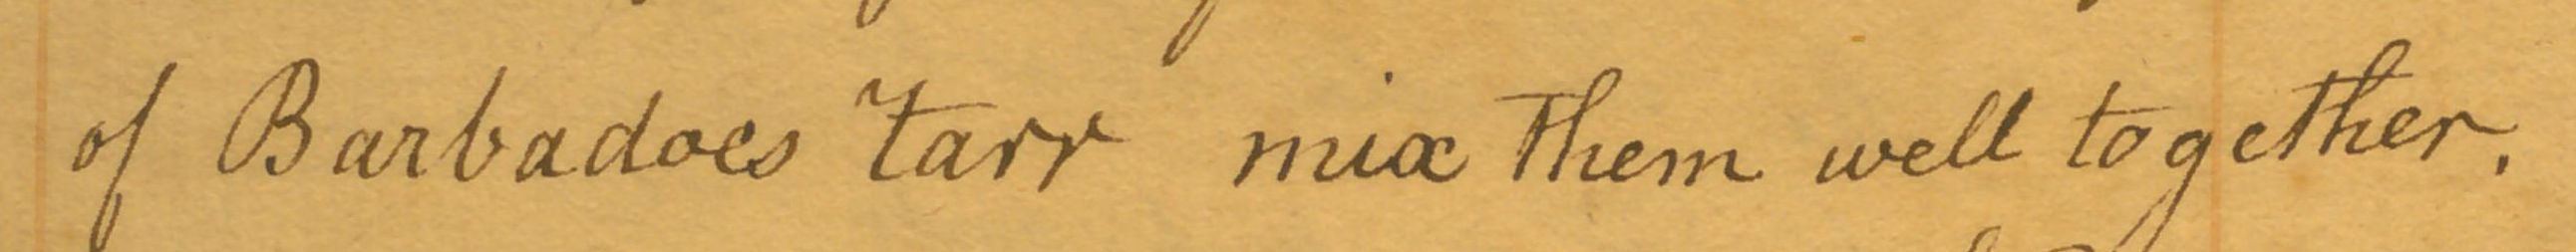of Barbadoes tarr mix them well together.
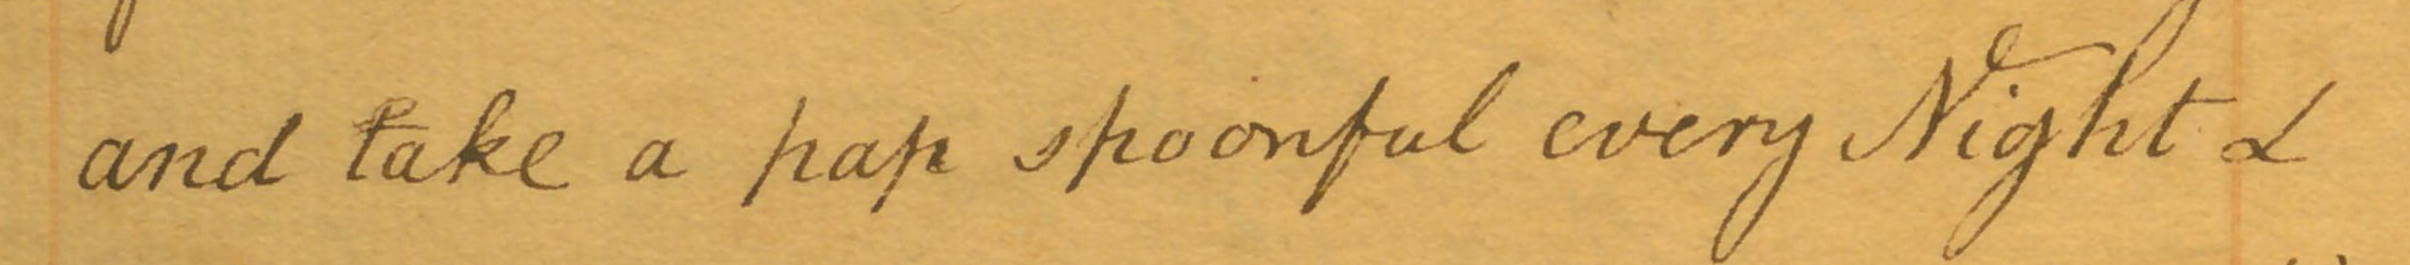and take a pap spoonful every Night &
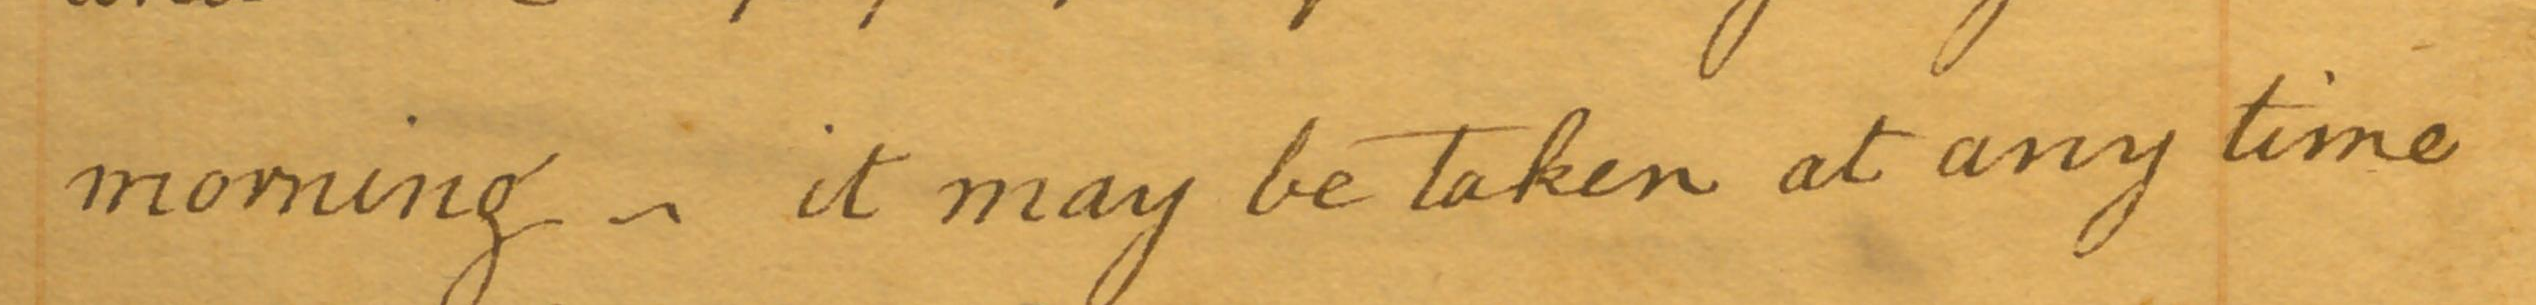morning- it may be taken at any time
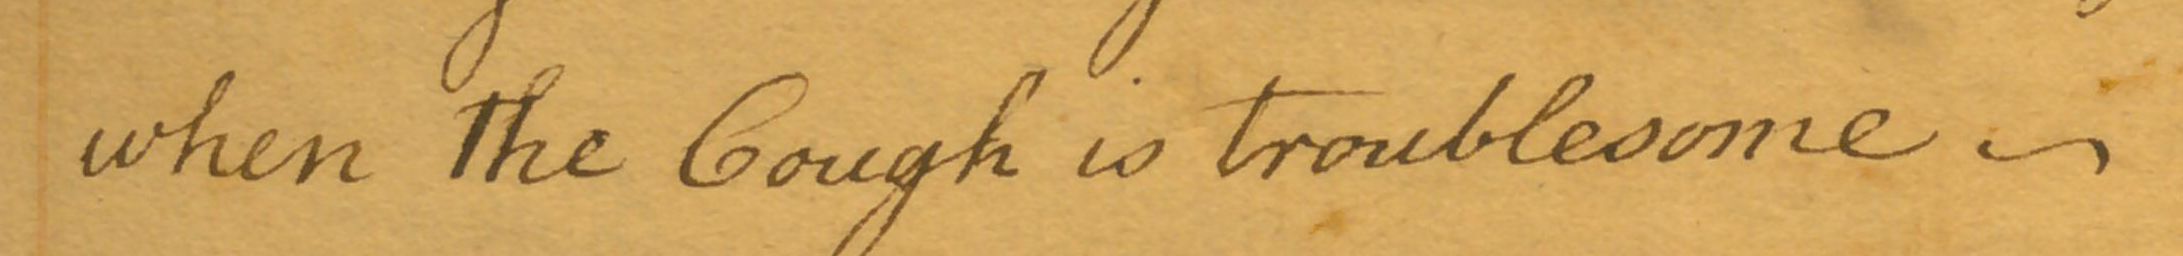when the Cough is troublesome-
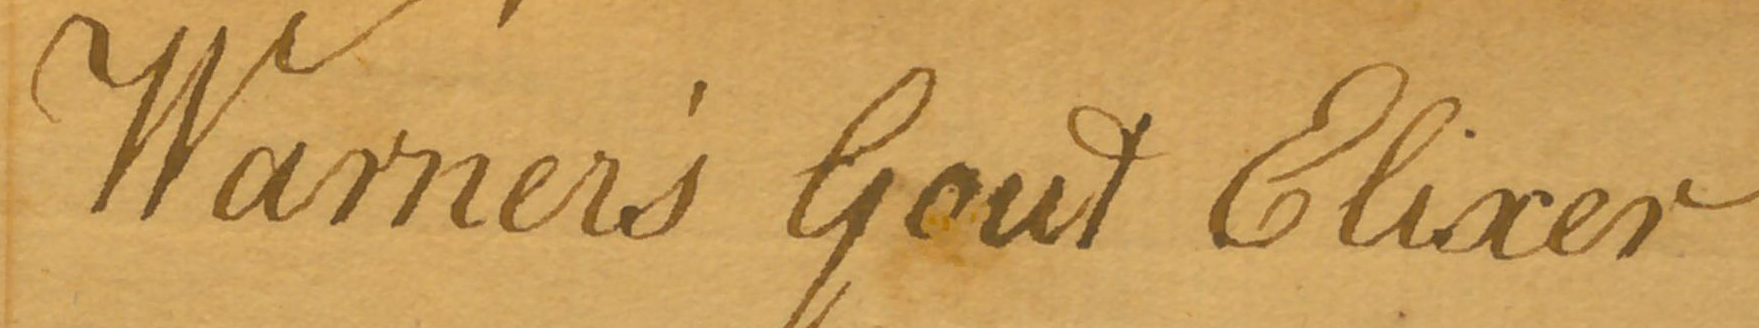Warner's Gout Elixer
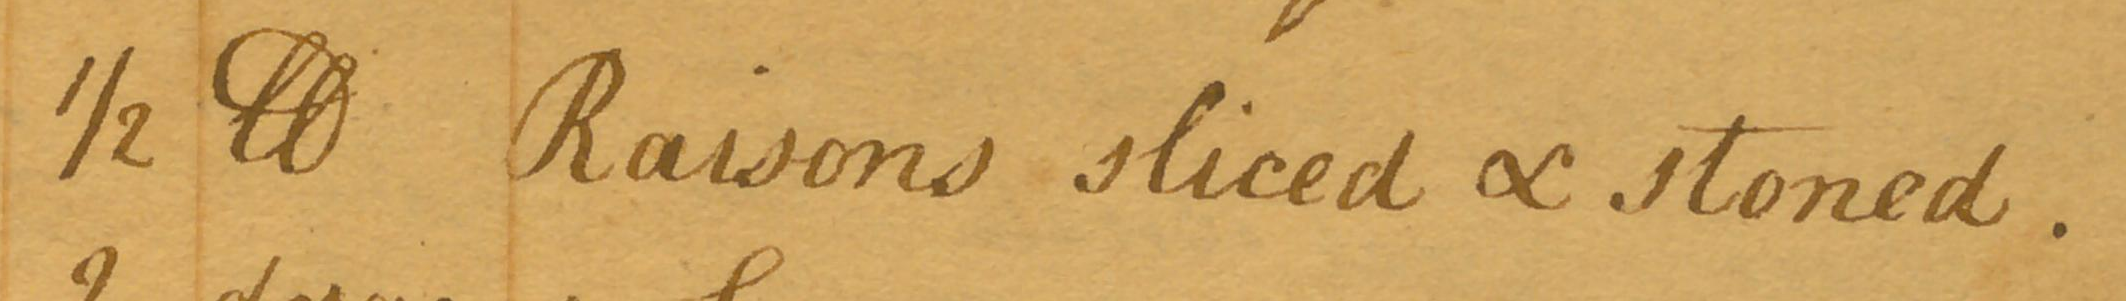1/2 lb Raisons sliced & stoned.
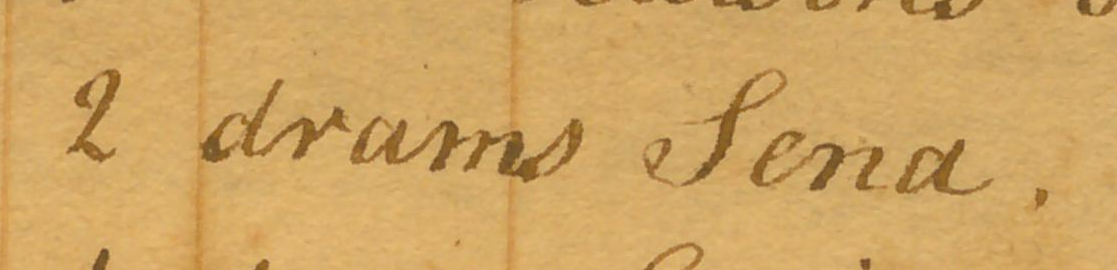2 drams send.
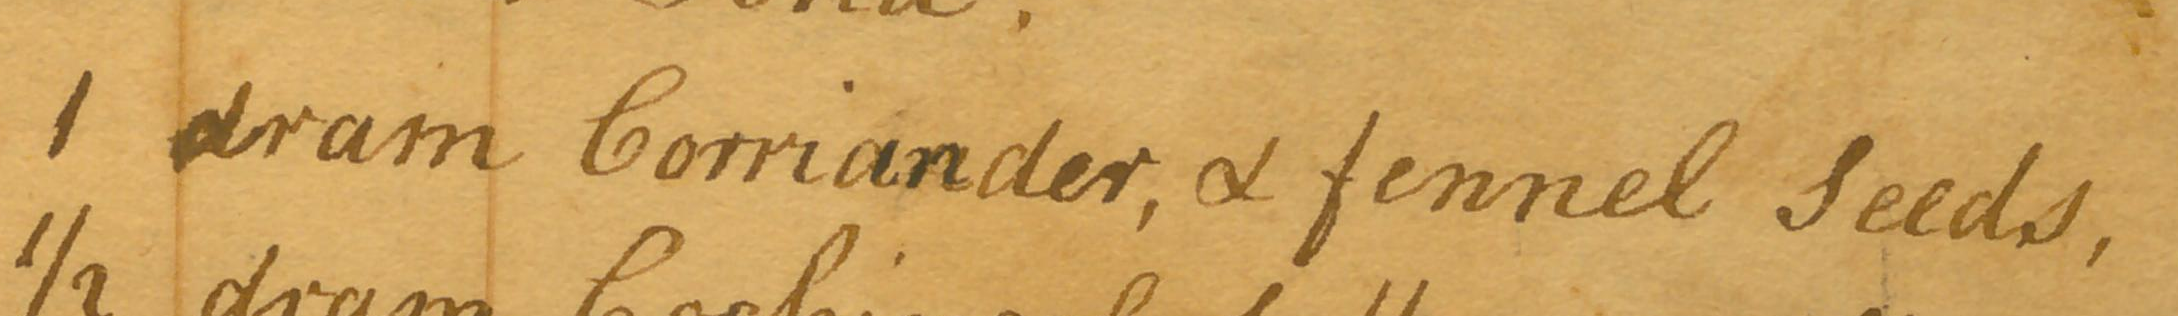1 dram Corriander, & fennel seeds,
